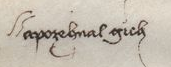apozehnal gich
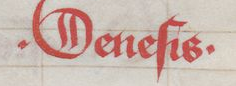.Geneſis.
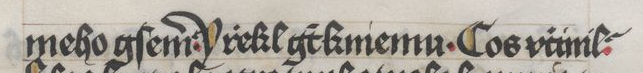meho gſem.Y ṙekl ḡt kníemu.Cos vċinil?
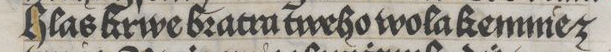Hlas krwe bratra tweho wola kemnie z
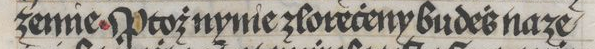zemie.Ꝓtoż nynie zloreċeny budeṡ naze¬
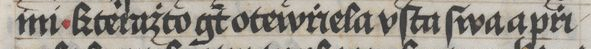mí.kterażto ḡt otewṙiela vſta ſwa a pṙi¬
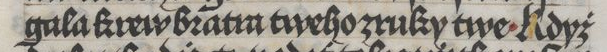gala krew bratra tweho zruky twe.Kdyż
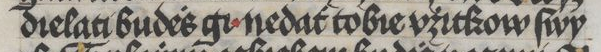dielati budeṡ gi.nedat tobie vżitkow ſwy¬
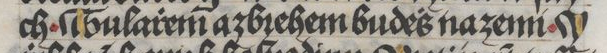ch.Tulaṙem a zbiehem budeṡ na zemí.Y
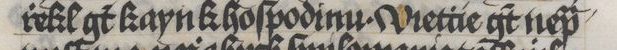ṙekl ḡt kayn k hoſpodinu.Vietċíe ḡt nep̃¬
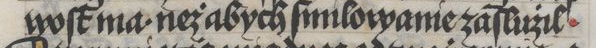woſt ma.neż abych ſmilowaníe zaſlużil.
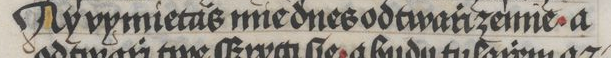Ay vymíetas mie dnes odtwaṙi zemie.a
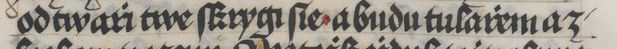od twaṙi twe ſkrygi ſie.a budu tulaṙem a z¬
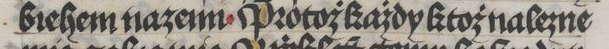biehem nazemi.Protoż każdy ktoż nalezne
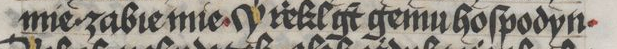mie.zabie mie.Y ṙekl ḡt gemu hoſpodyn.
